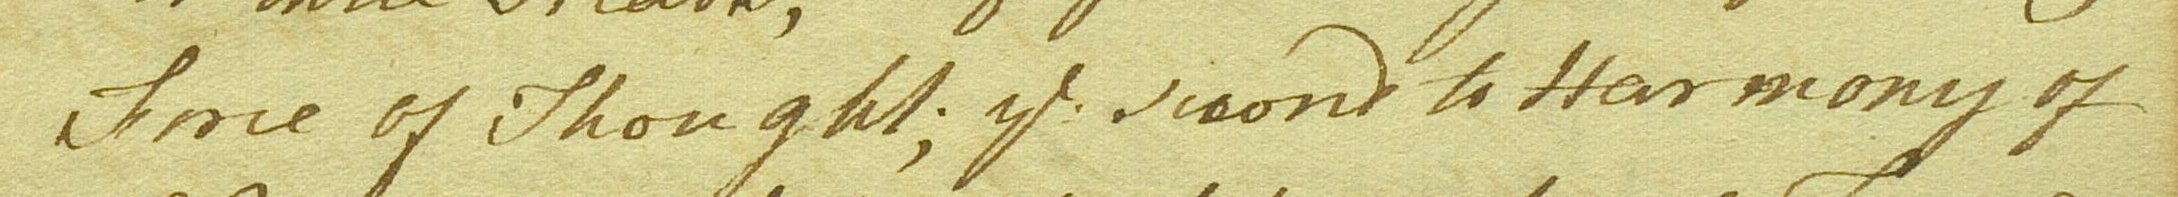Fire of Thought; y^e: second to Harmony of
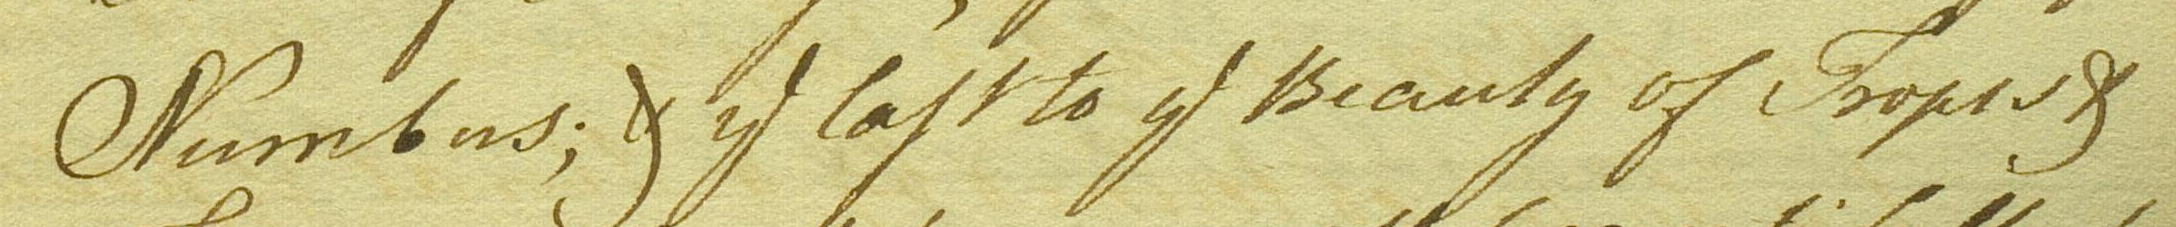Numbers; & y^e last to y^e Beauty of Tropes &
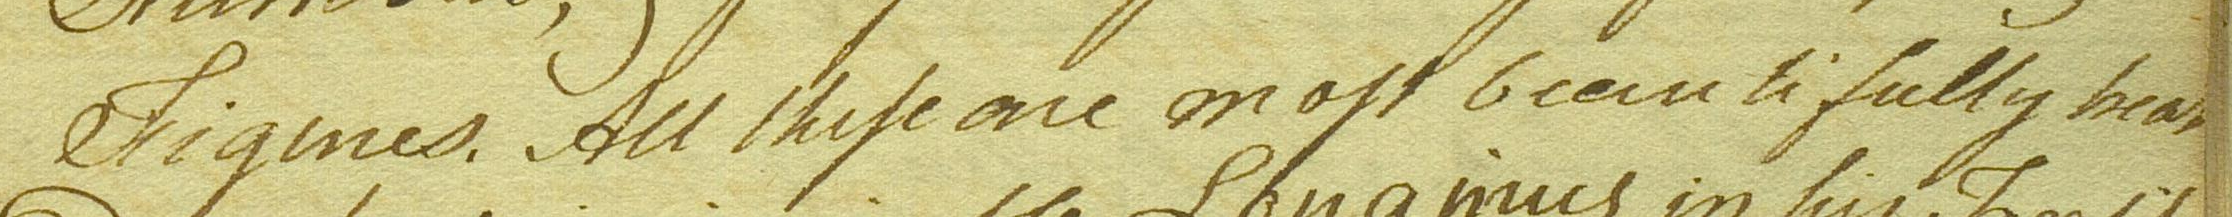Figures. All these are most beautifully hear
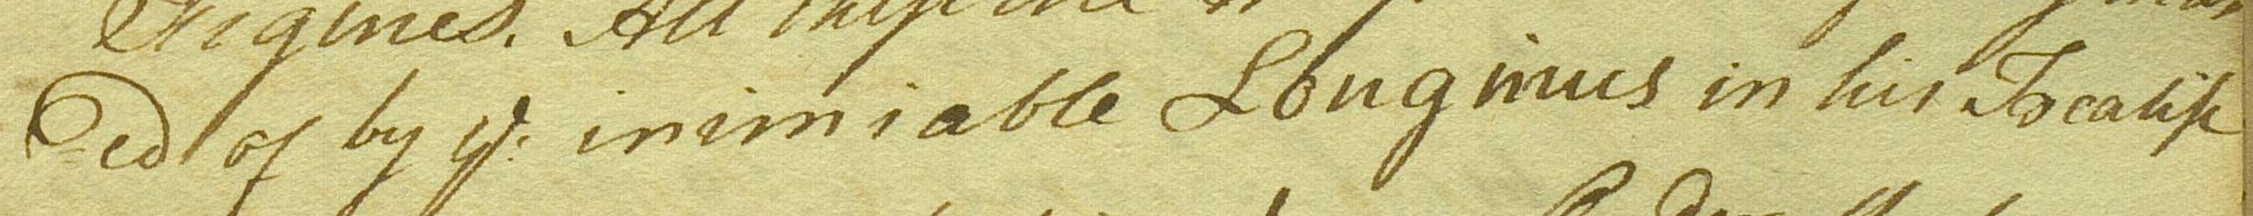-ed of by y^e inimiable Longinus in his Treatise
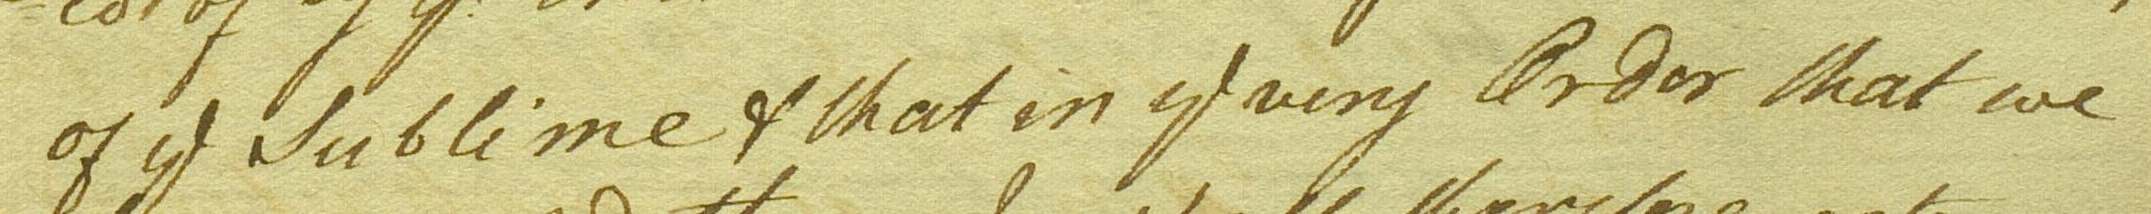of y^e Sublime & that in y^e very Order that we
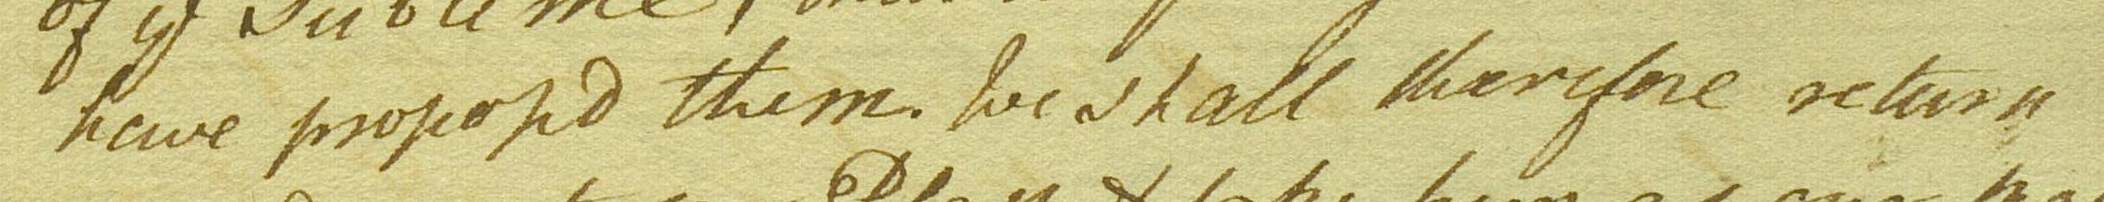have proposed them. We shall therefore return
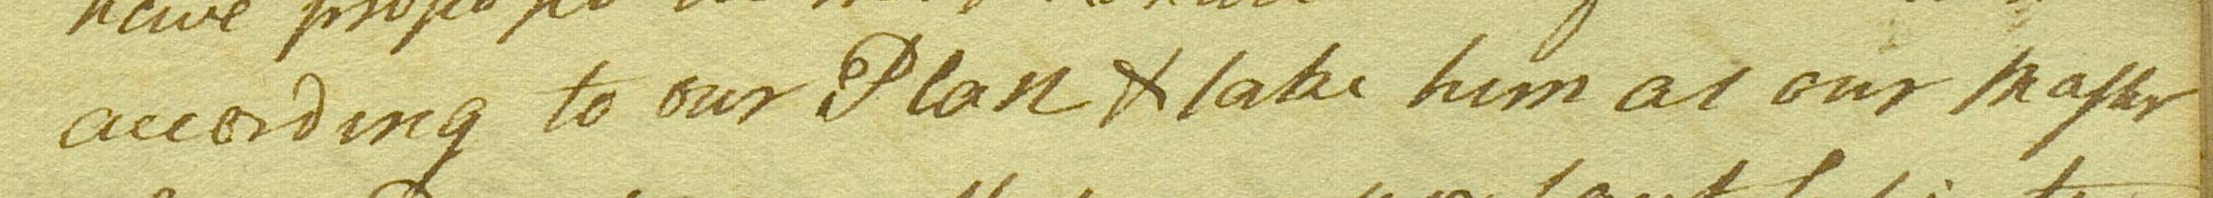according to our Plan & take him as our Master
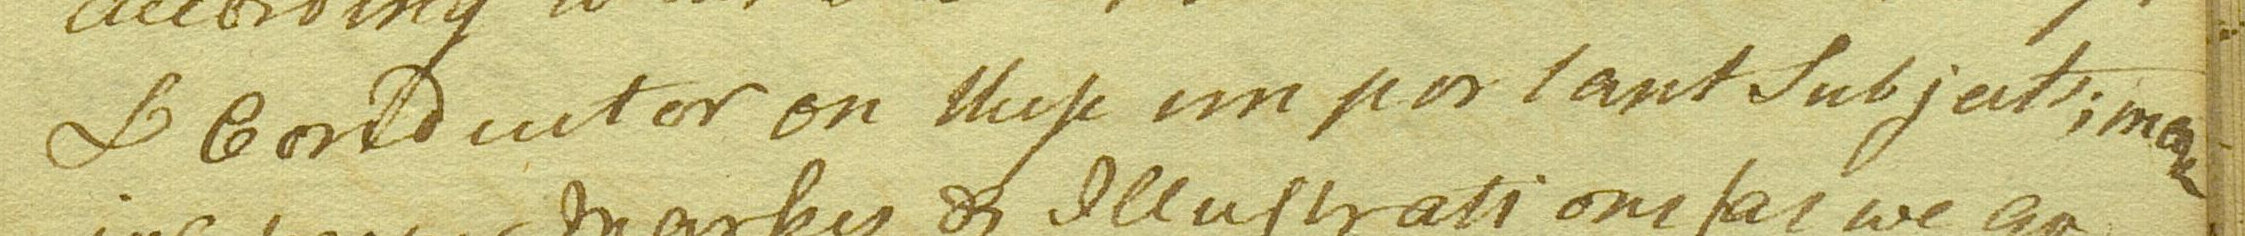& Conductor on these important Subjects; mak
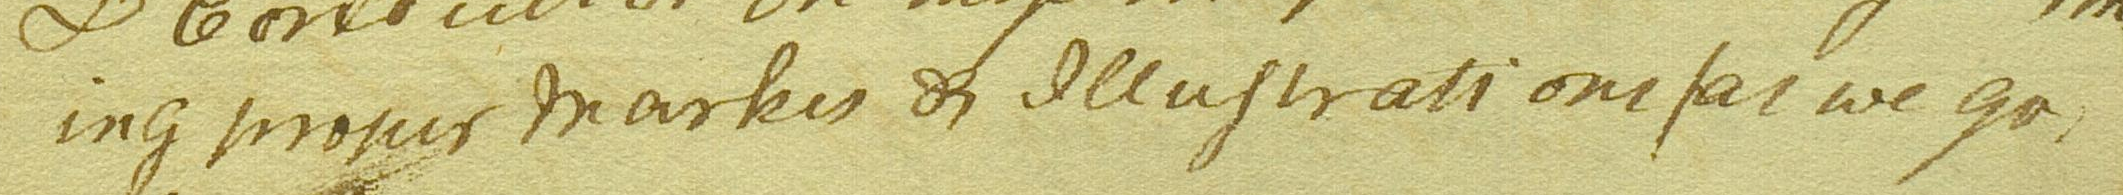-ing proper Markes & Illustrations (as we go
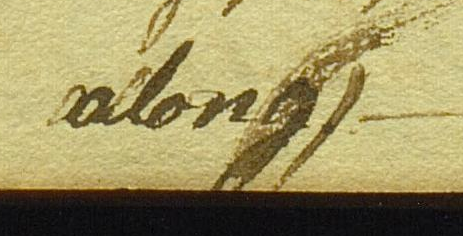along)-
